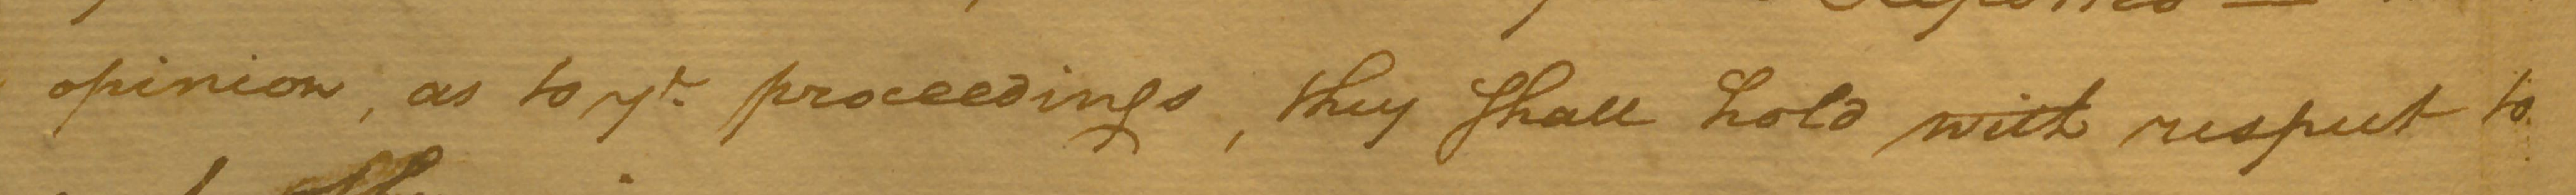opinion, as to y^e. proceedings, they shall hold with respect to
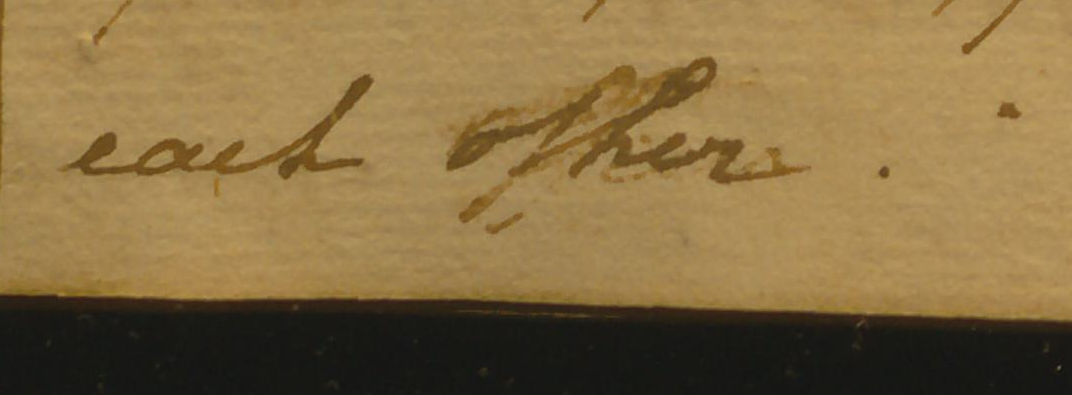each other.
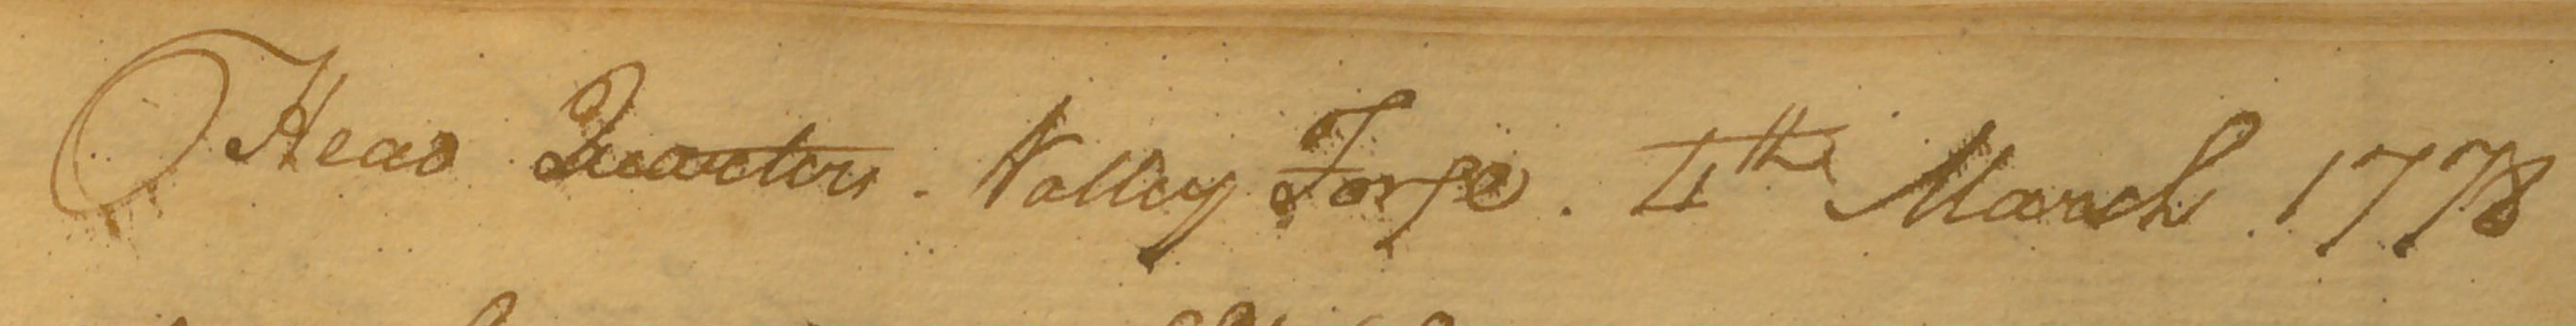Head Quarters. Valley Forge. 4^th March 1778
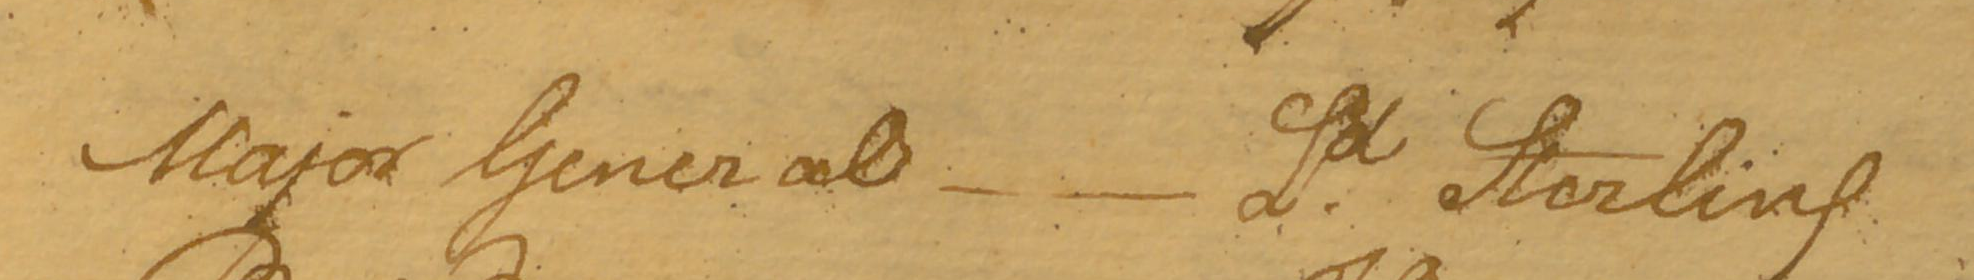Major General-- L^d. Sterling
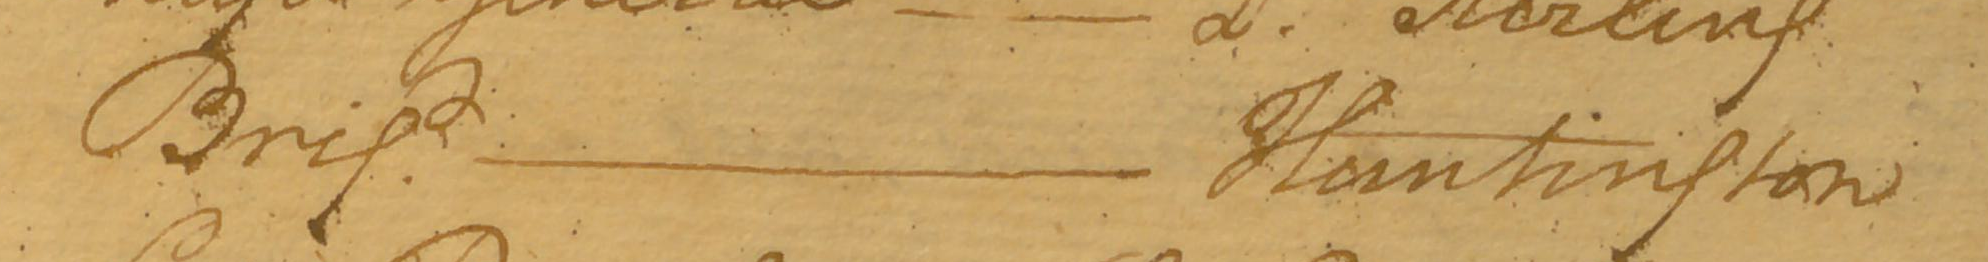Brig^d- Huntington
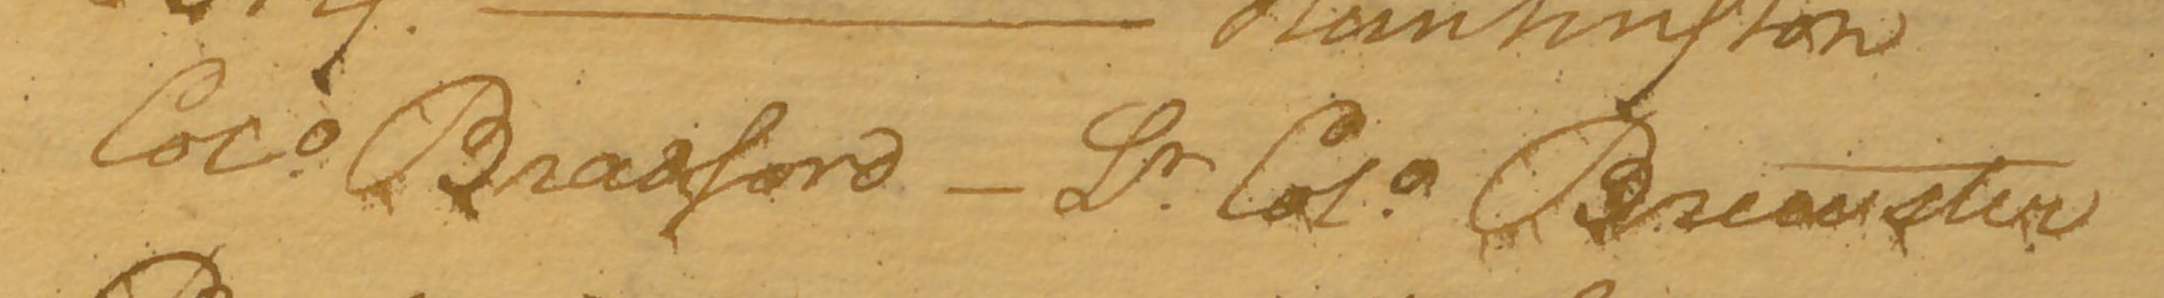Col^o. Bradford- L^t. Col^o. Brewster
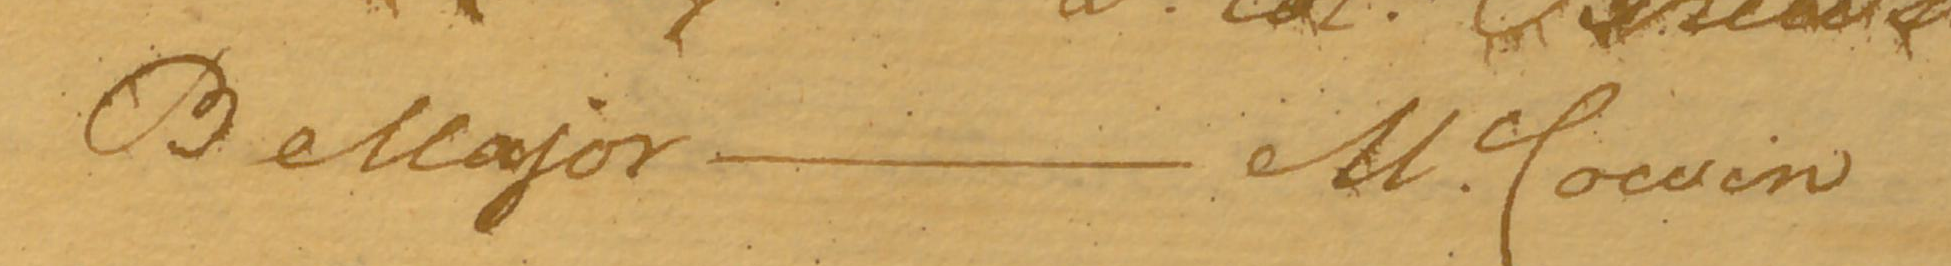B Major- M. Cowin
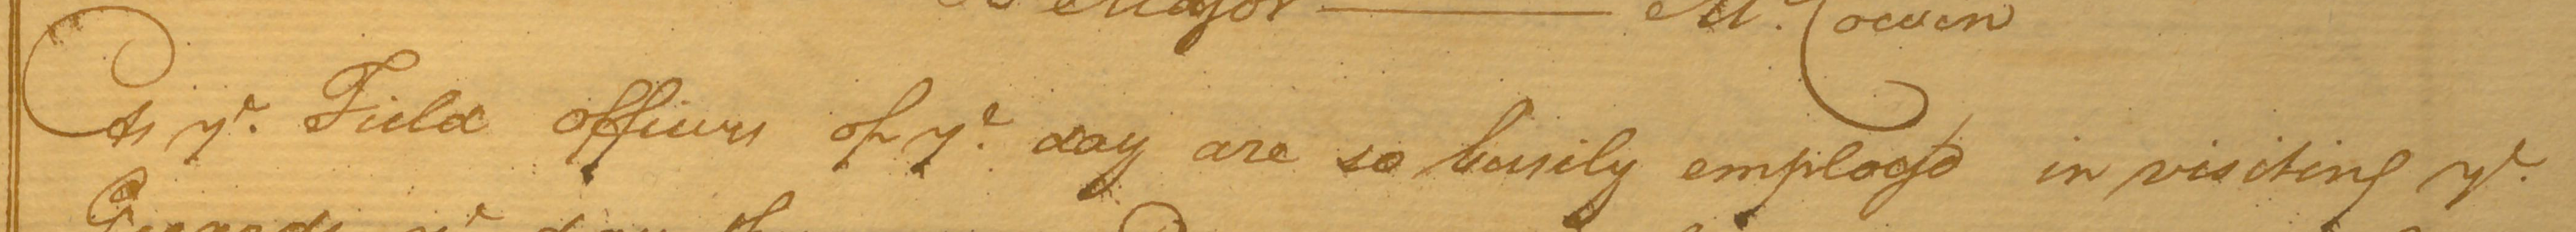As y^e. Field officers of y^e. day are so busily employ'd in visiting y^e.
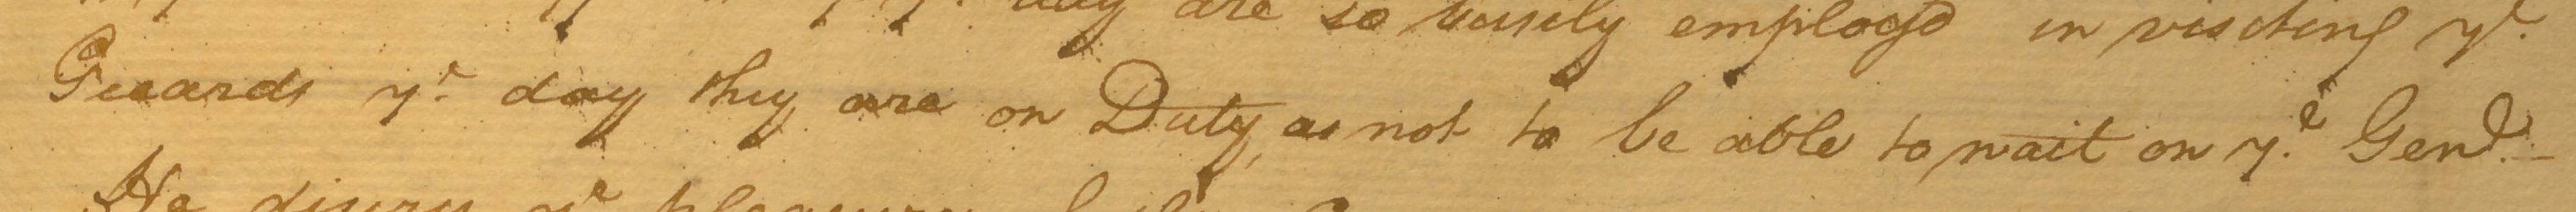Guards y^e. day they are on Duty as not to be able to wait on y^e. Gen^l.
